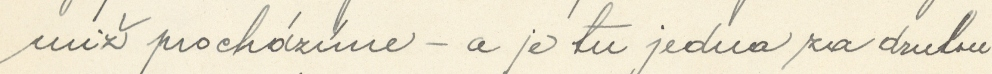miž procházíme - a je tu jedna za druhou -
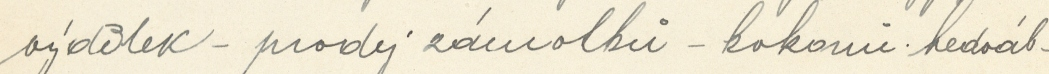výdělek - prodej zámotků - kokonů hedváb-
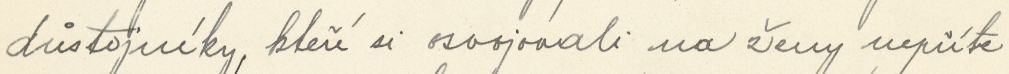důstojníky, kteří si osvojovali na ženy nepříte-
